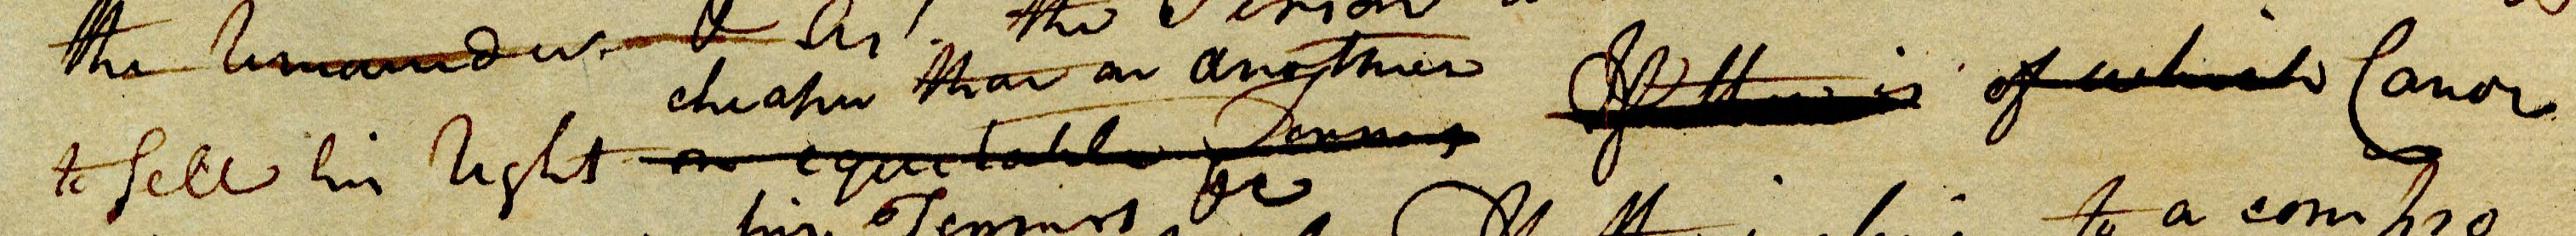to sell his right [in equitable Terms] [If this is] [of which] Canor
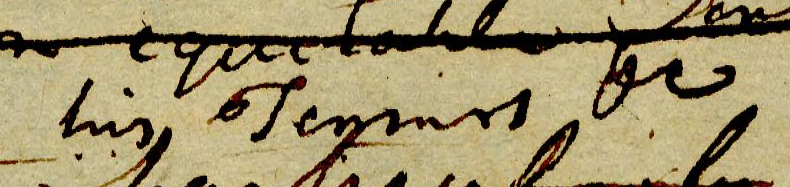his Terms &c
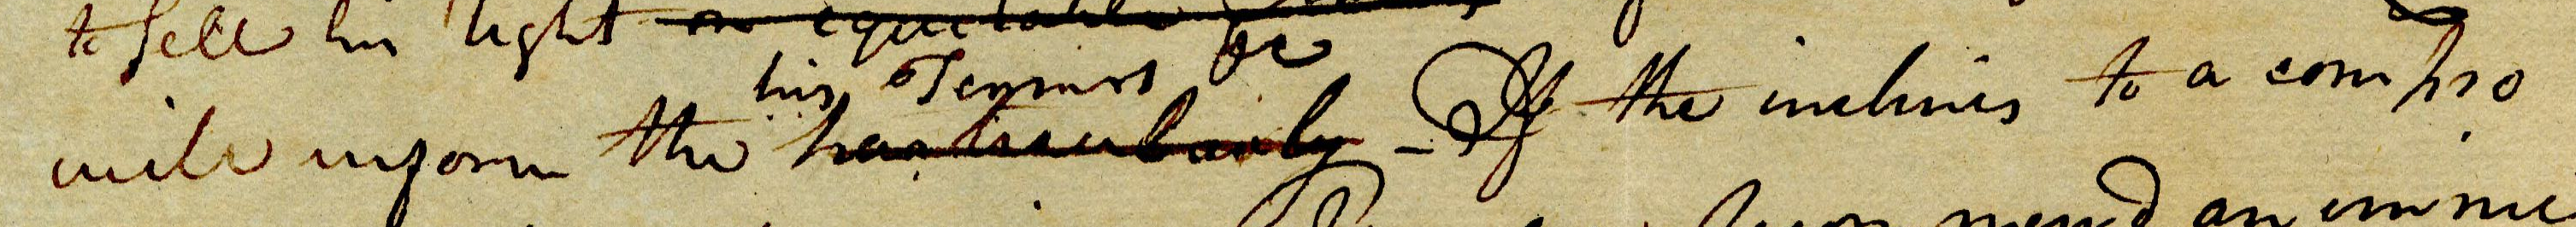will inform the [particularly] If the inclines to a compro
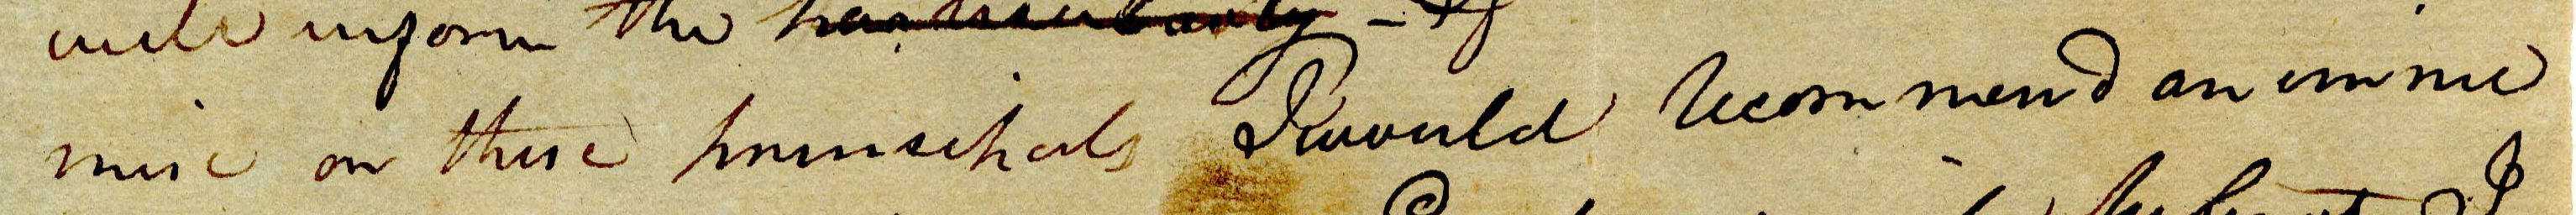mise on these prinsipals I would recommend an imme
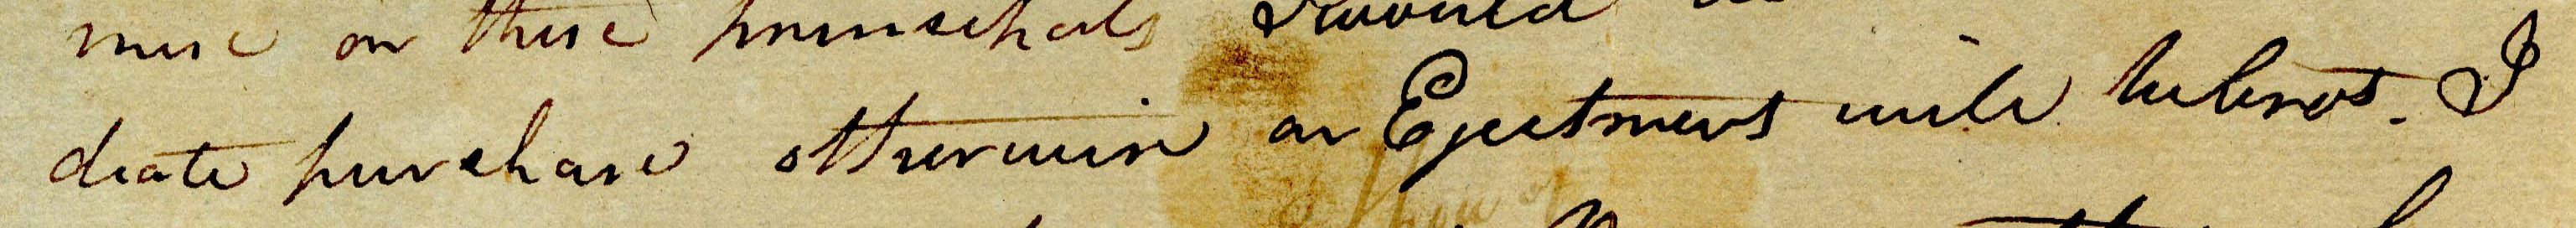diate purchase otherwise an Ejectment will be bro^t. I
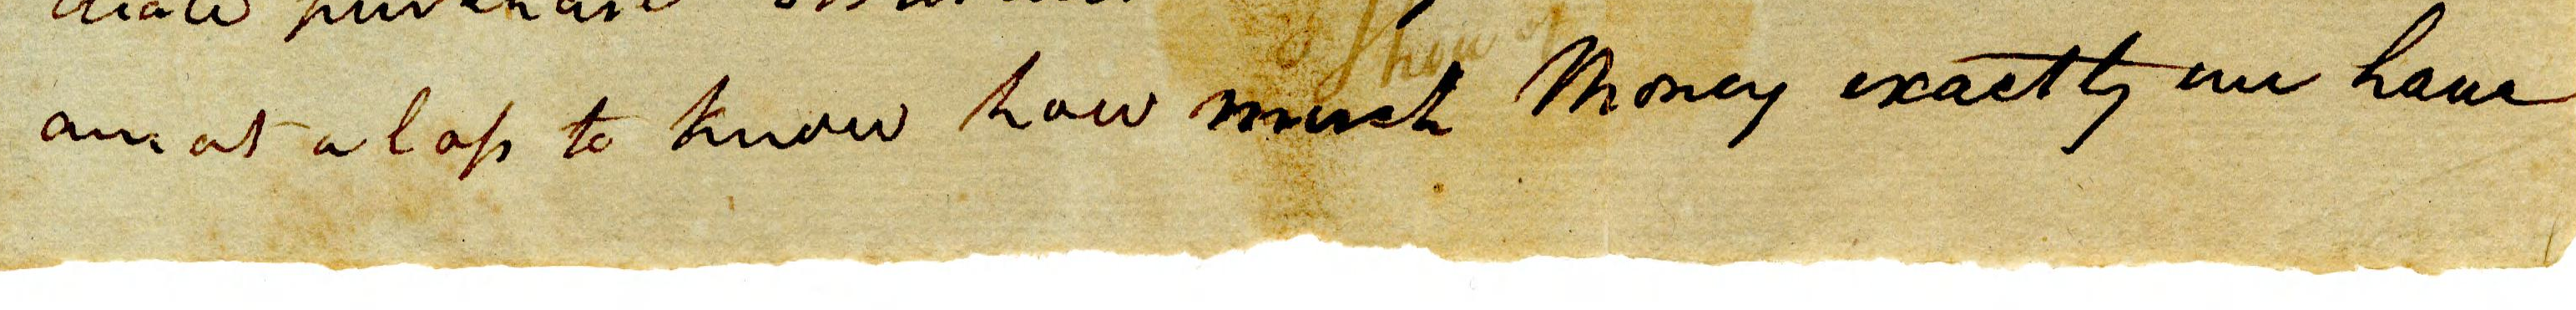am at a loss to know how much money exactly we have
